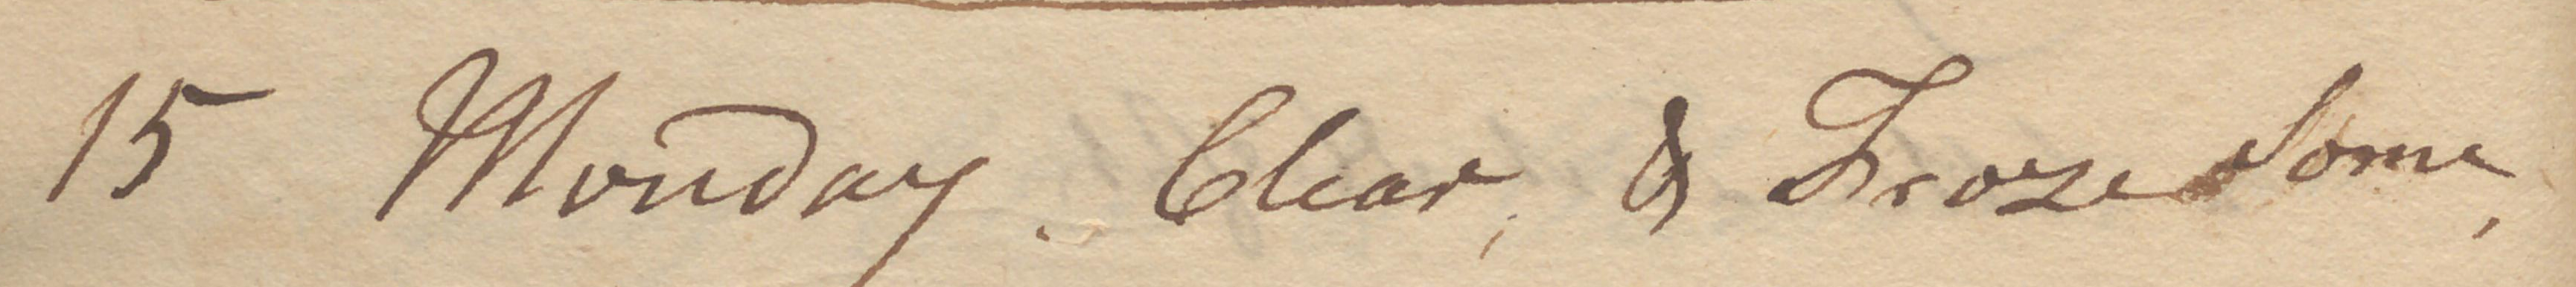15 Monday Clear & Froze some
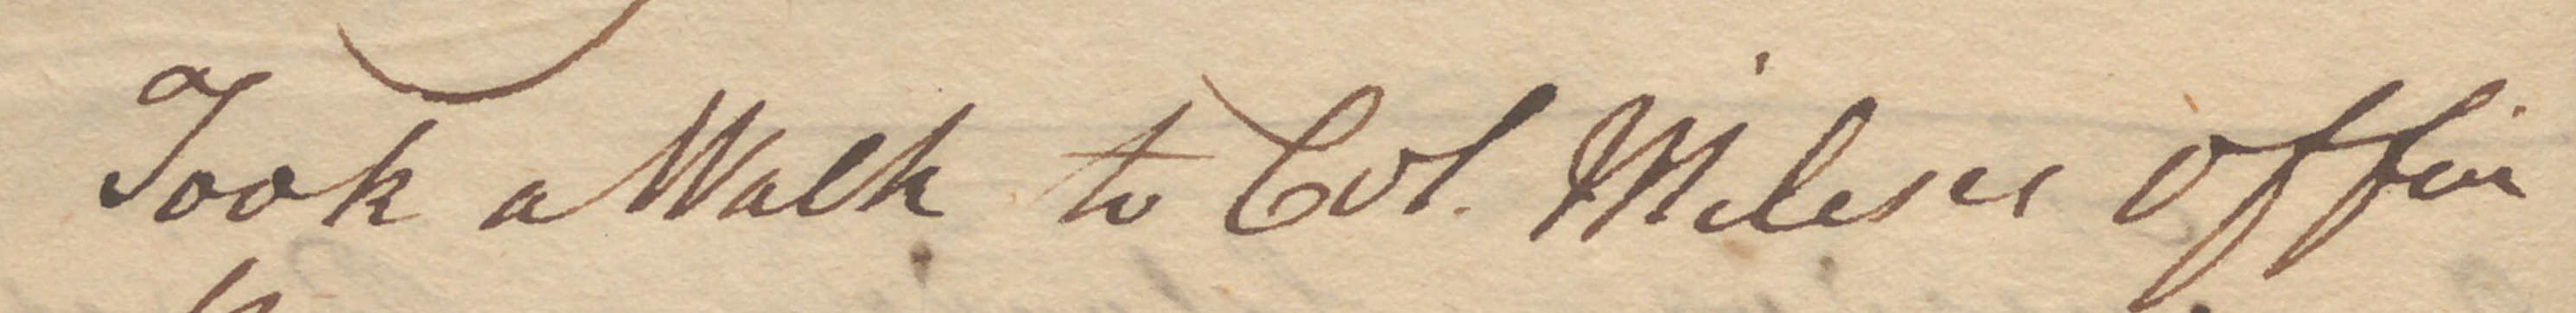Took a Walk to Col. Mileses office
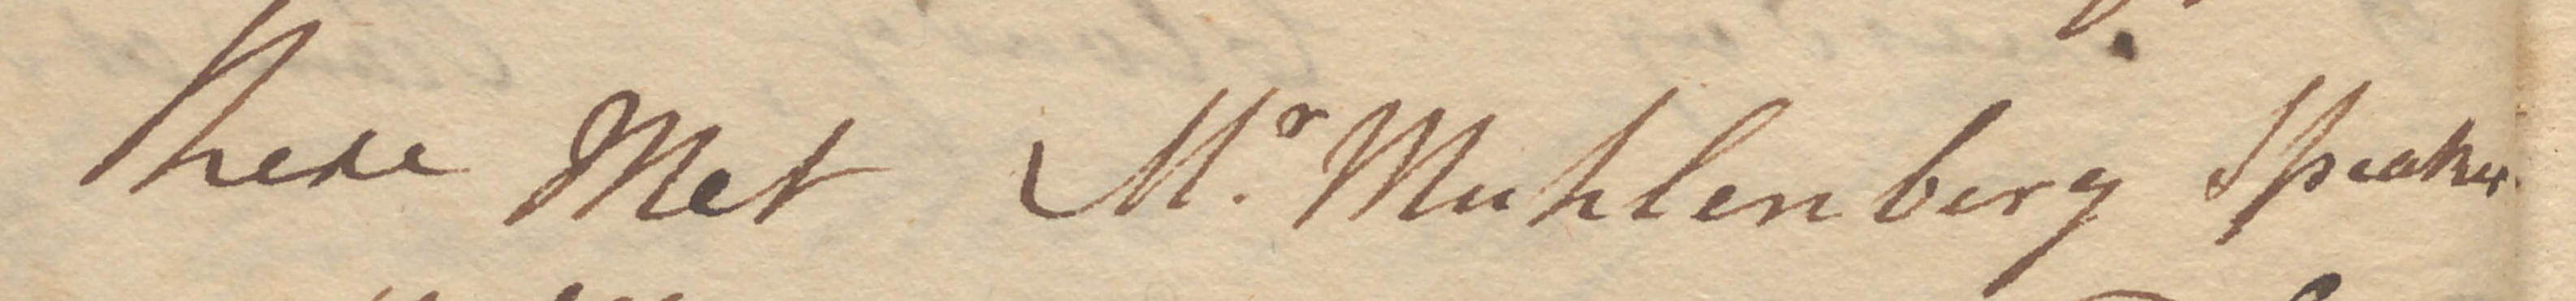there Met M^r. Muhlenberg Speaks
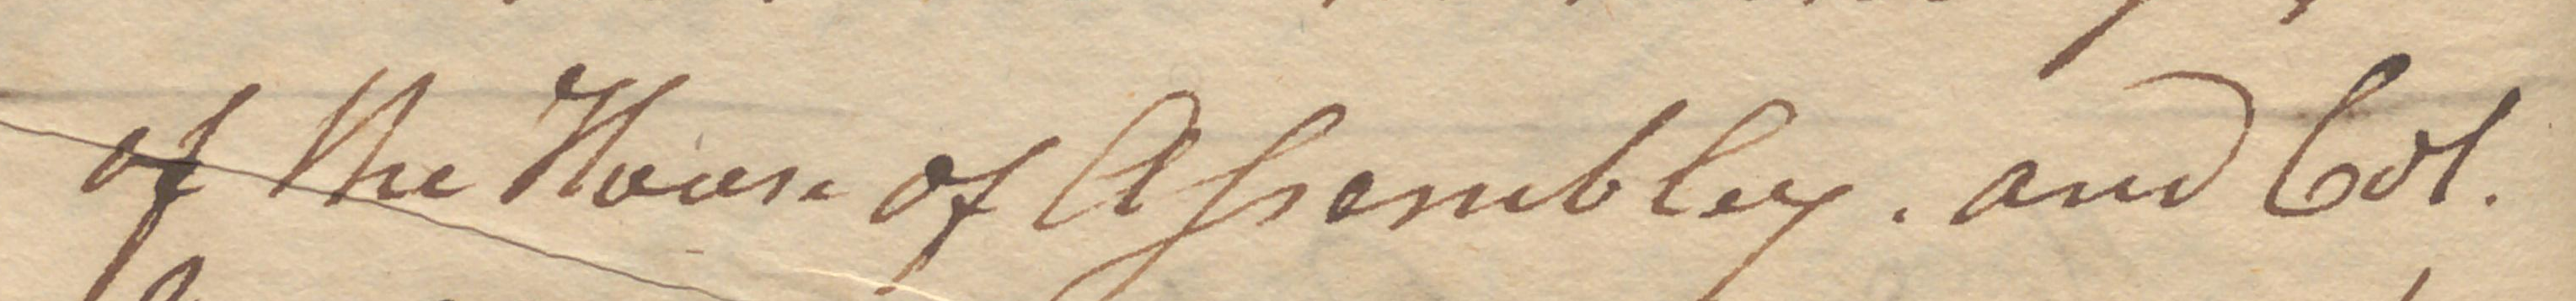of the House of Assembley. and Col.
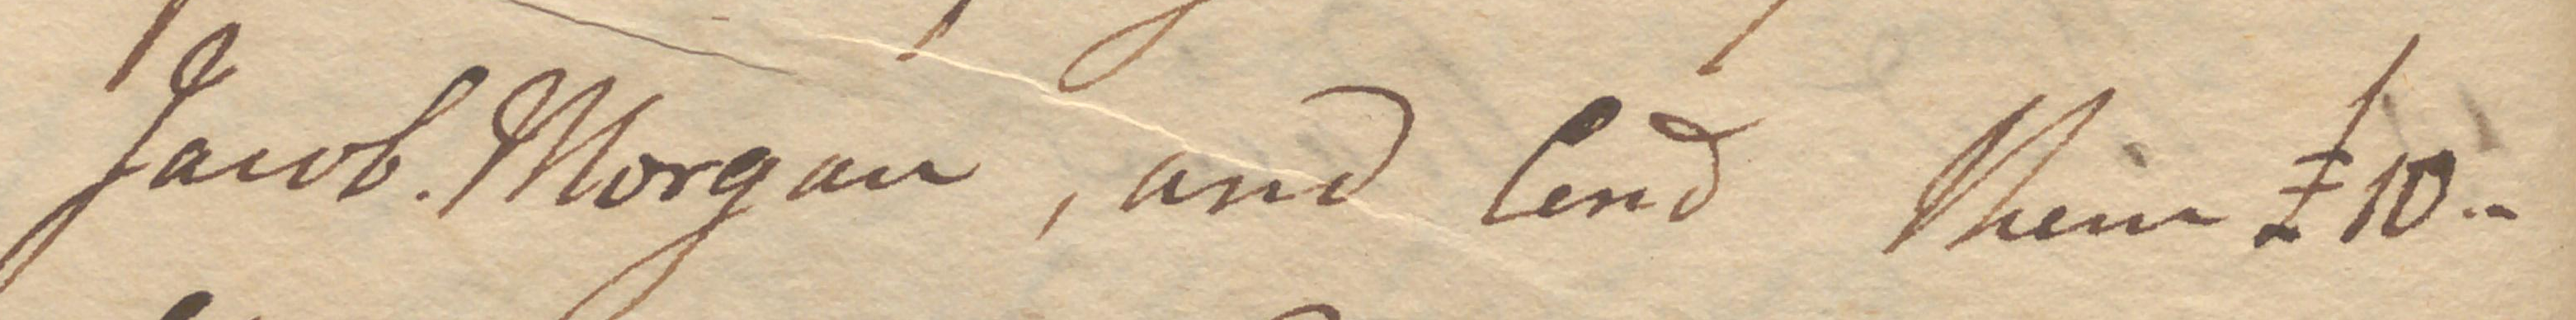Jacob. Morgan, and lend them £10.-
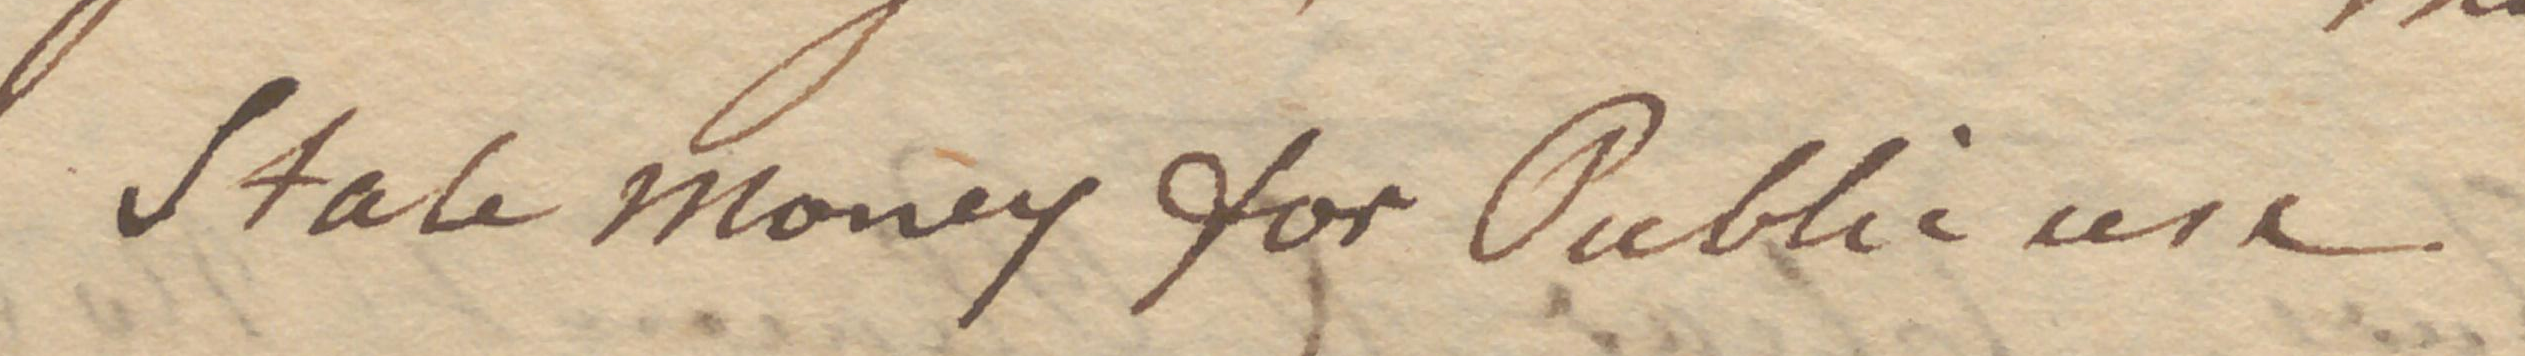State Money for Public use
